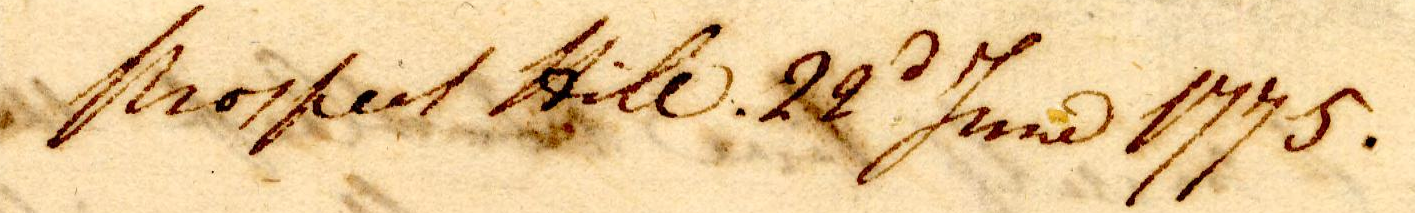Prospect Hill 22^d June 1775.
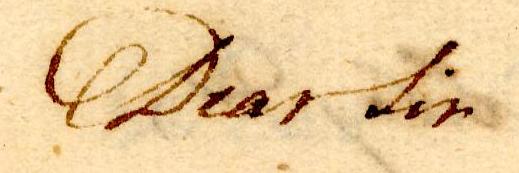Dear Sir
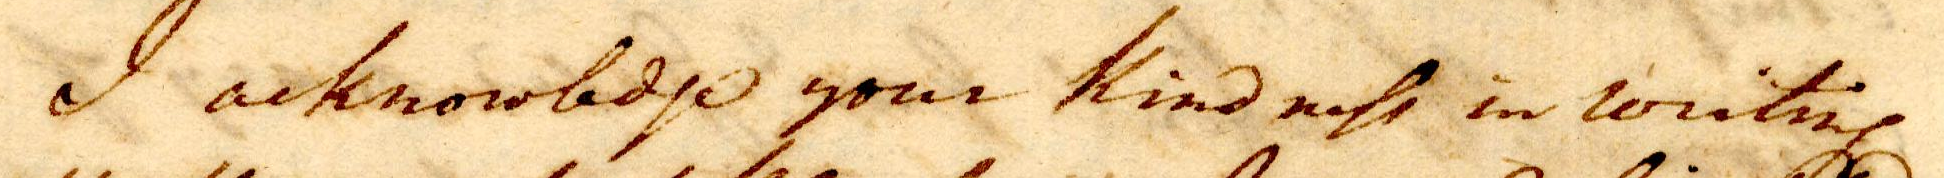I acknowledge your Kindness in writing
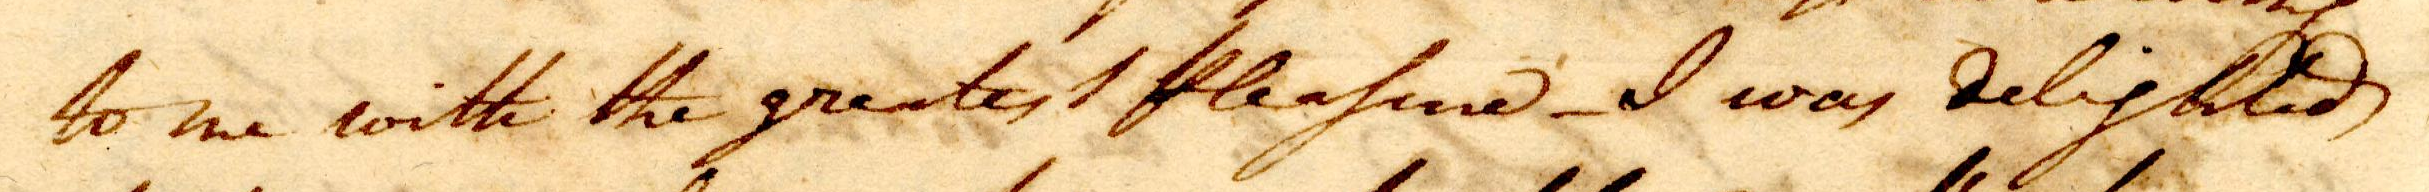to me with the greatest pleasure. I was delighted
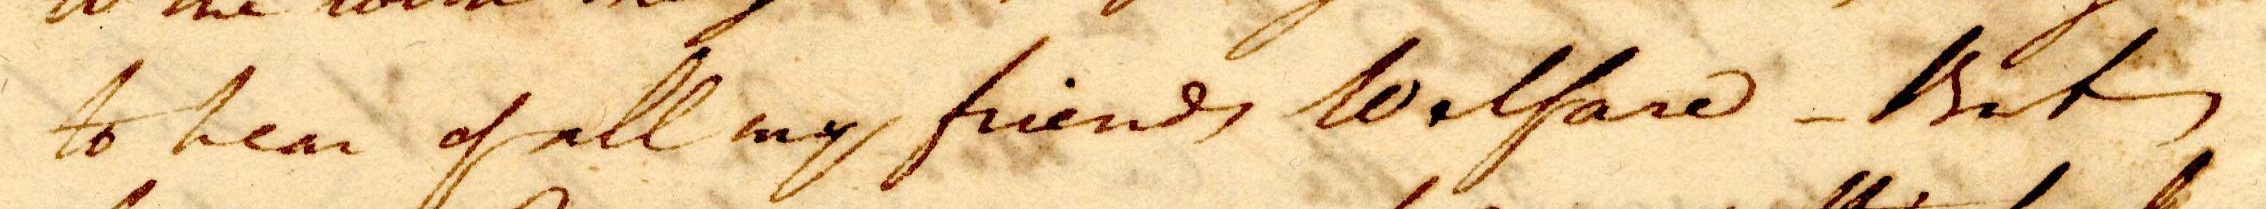to hear of all my friends Welfare- But
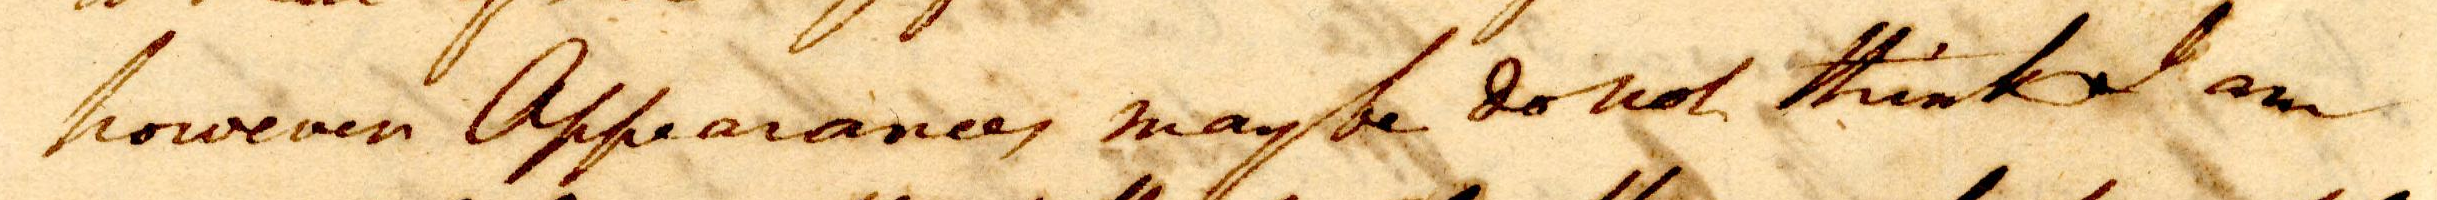however Appearances may be do not think I am
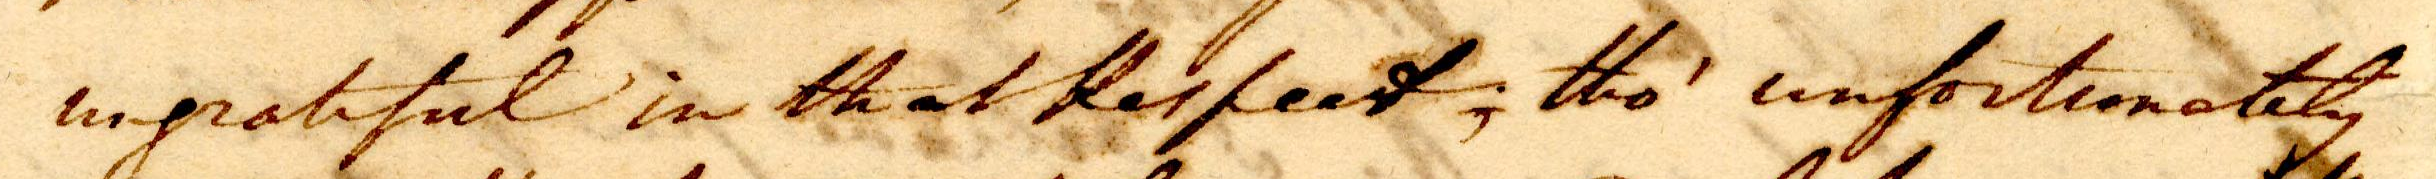ungrateful in that Respect, tho' unfortunately
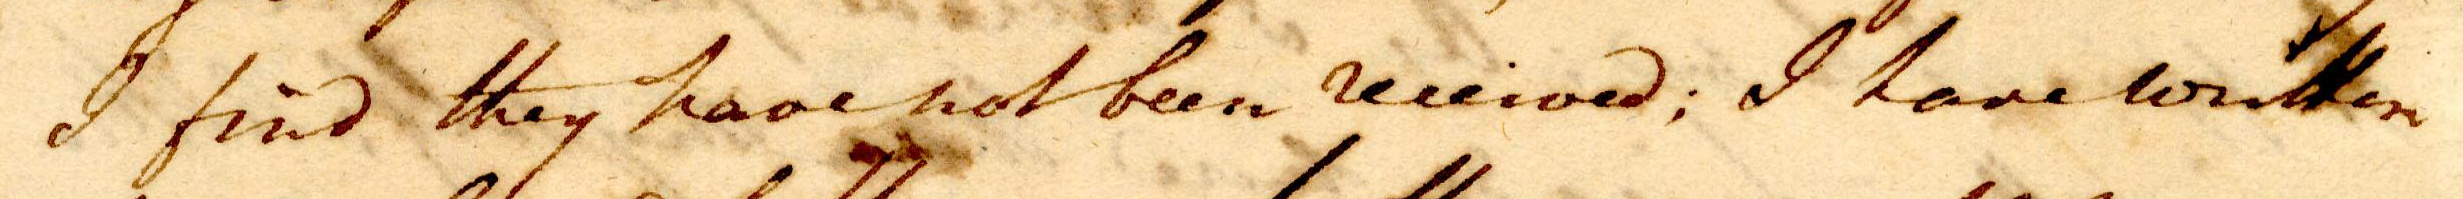I find they have not been received; I have written
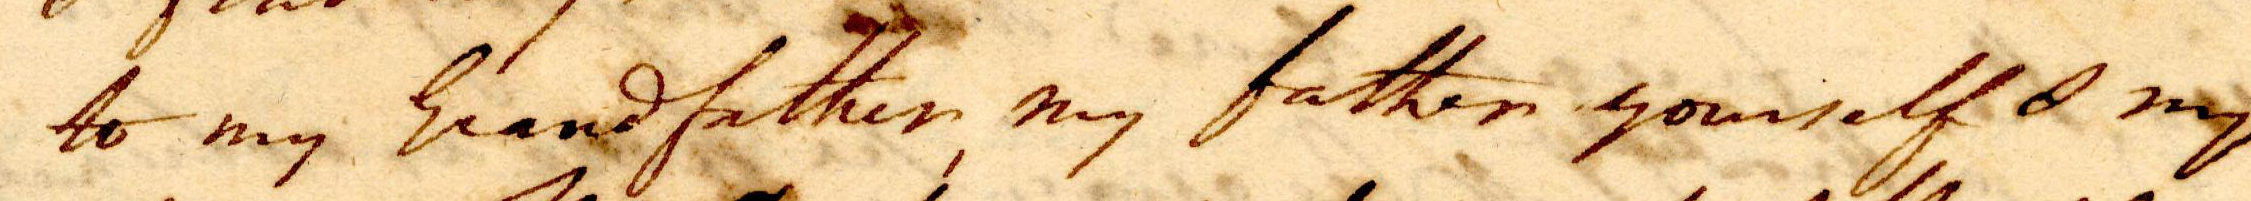to my Grandfather, my father, yourself & my
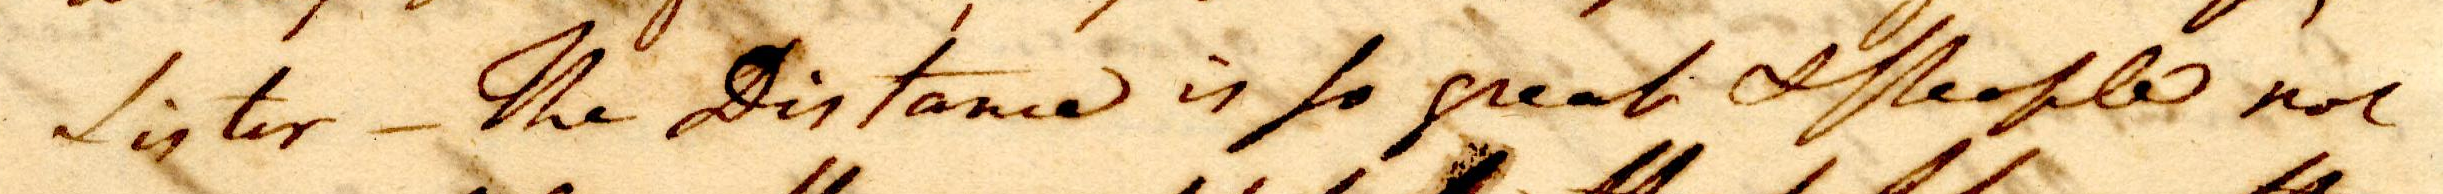Sister. The Distance is so great & People not
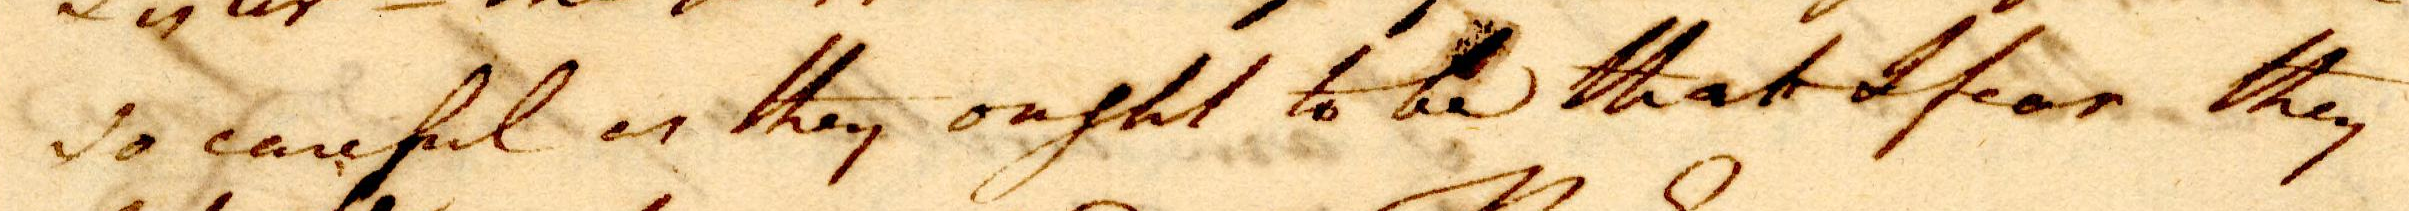so careful as they ought to be that I fear they
